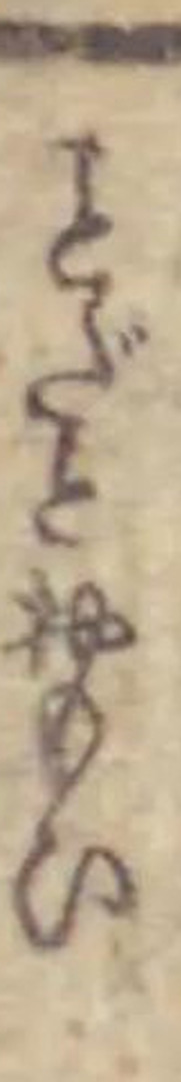ことだとおもひ
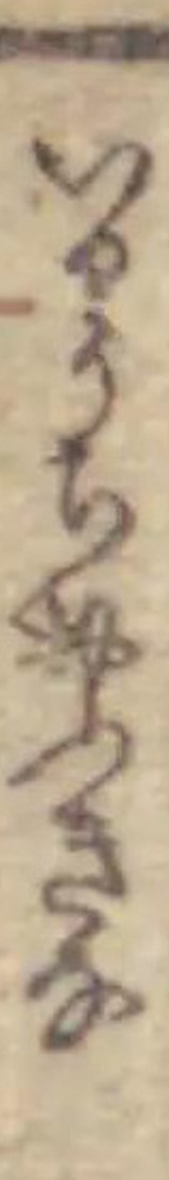いるうちおふきな
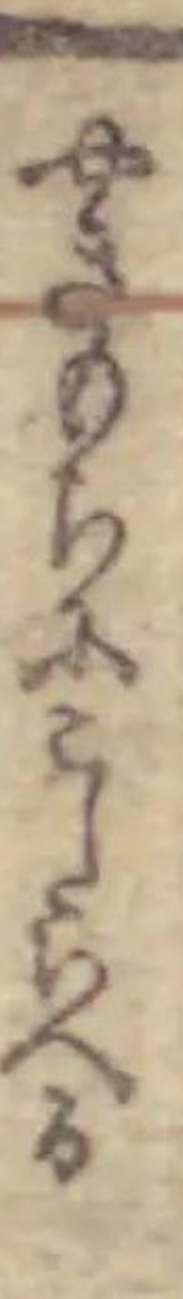やきもちにこしらへる
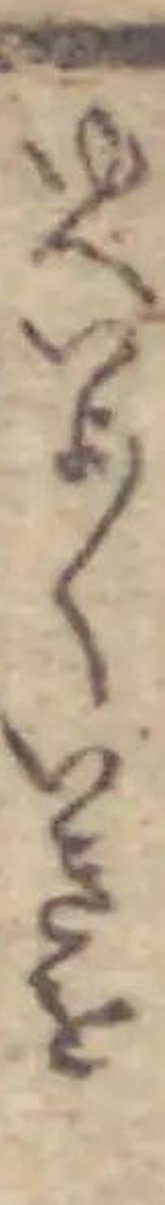ゆへいよ〳〵いきを
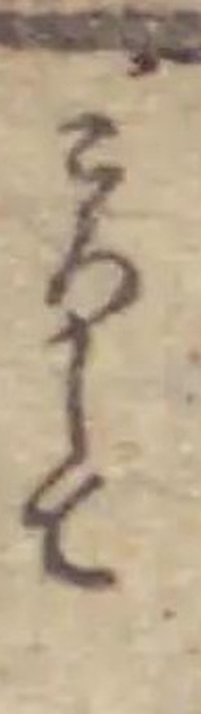ころして
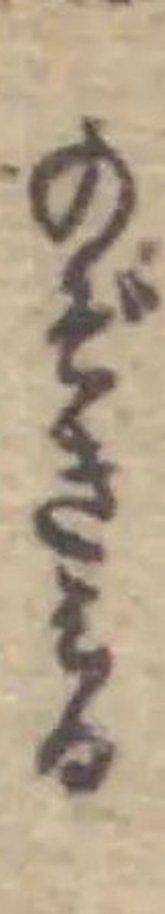のぞきみる

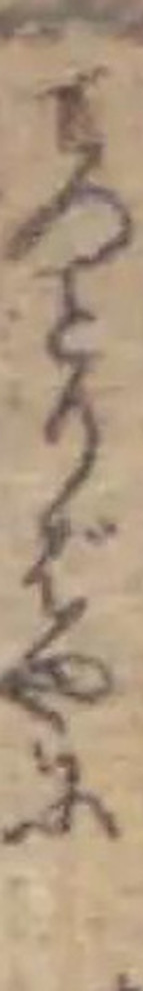てつとりばやに
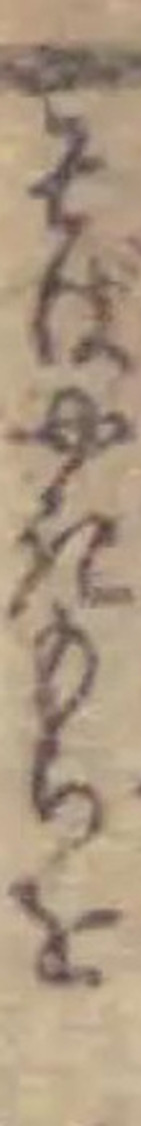そばやきもちを
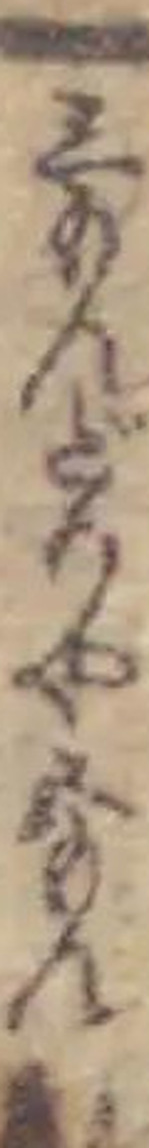三もんどりや五もん
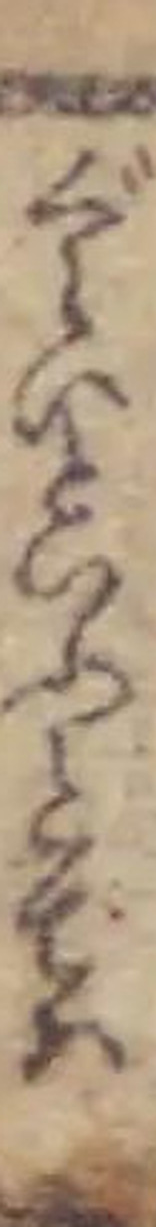ぐらいといふことては
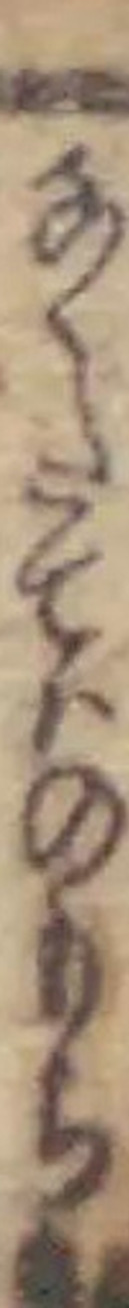なくさてはのもち
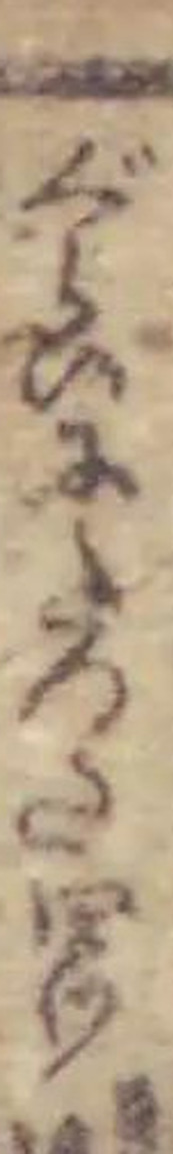ぐらいにたつた四つ
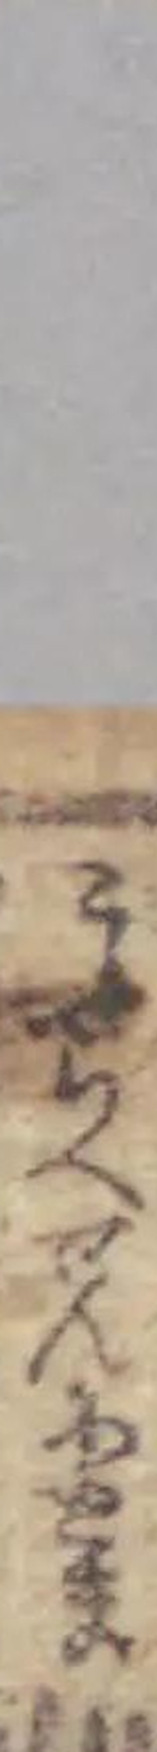こしらへせんにとま
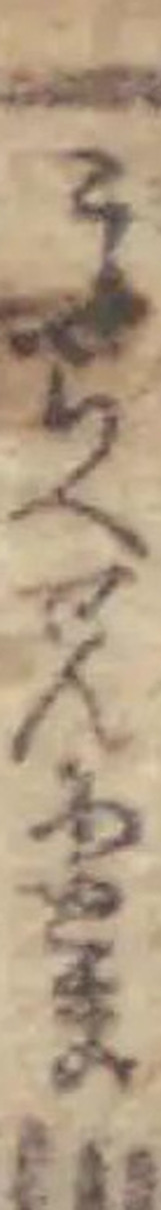こしらへせんにとま
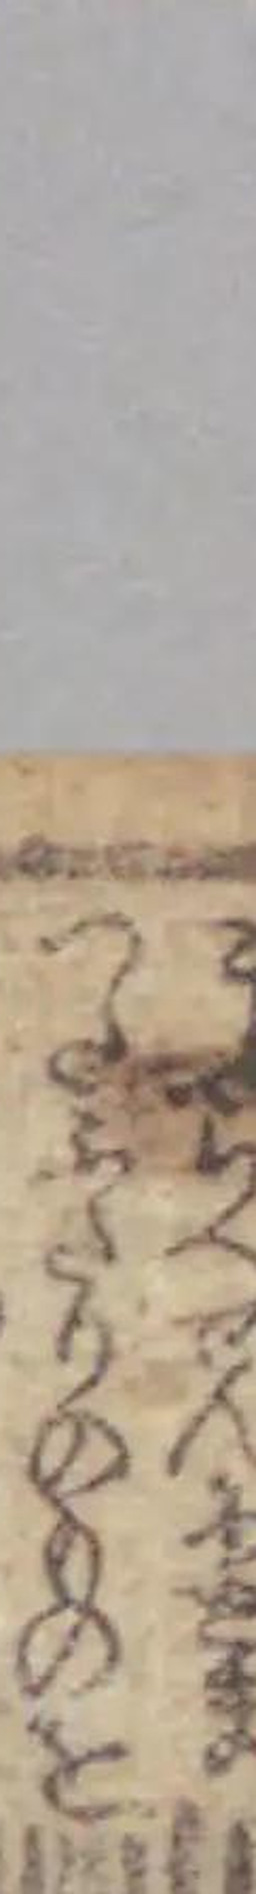つたふたりのものを
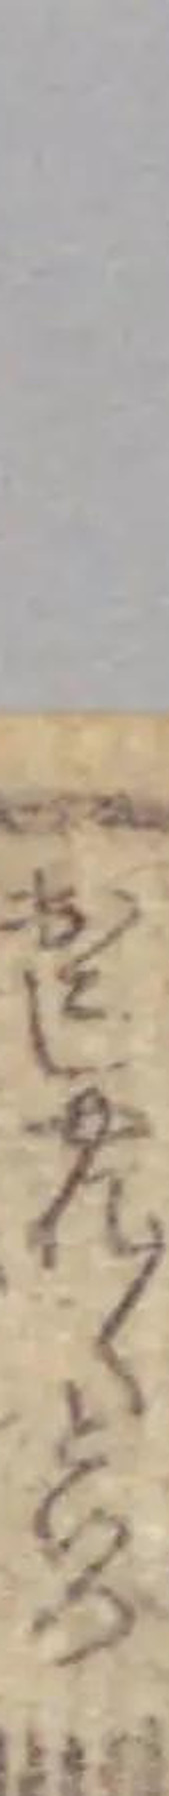おこしやれ〳〵といつ
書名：もふもふもふ怖噺 2巻
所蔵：国立国会図書館 National Diet Library, JAPAN
